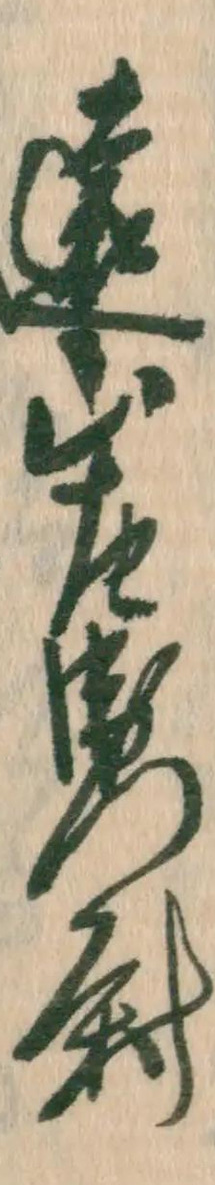遠山左衛門尉
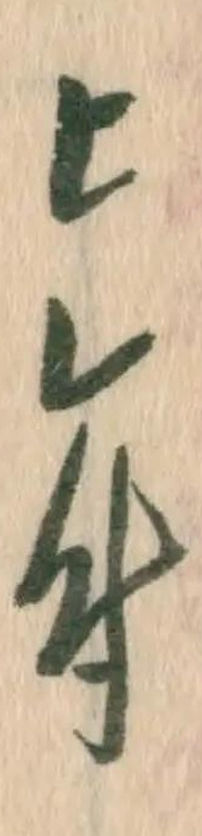ヒレ付
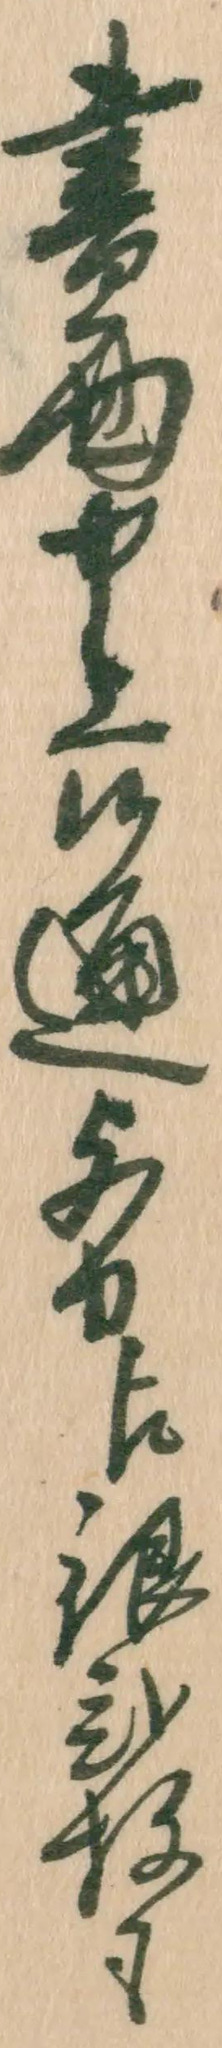書面申上候通与力え銀弐枚も
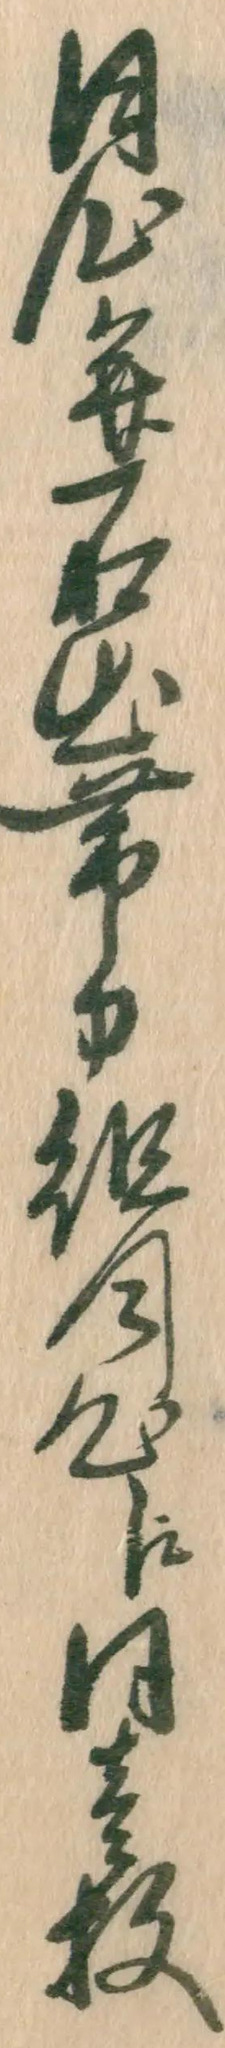同心幷石出帯刀組同心え同壱枚
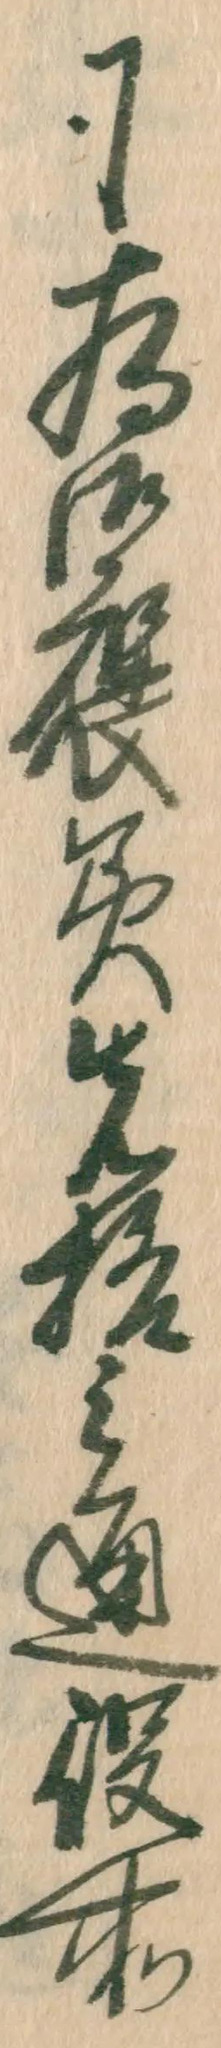も為御褒美先格之通役所
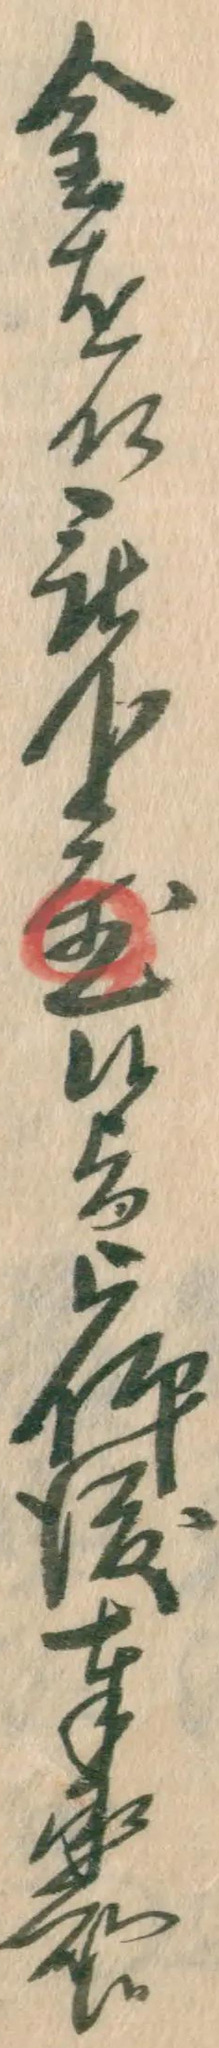金を以被下置候旨被仰渡奉承知候
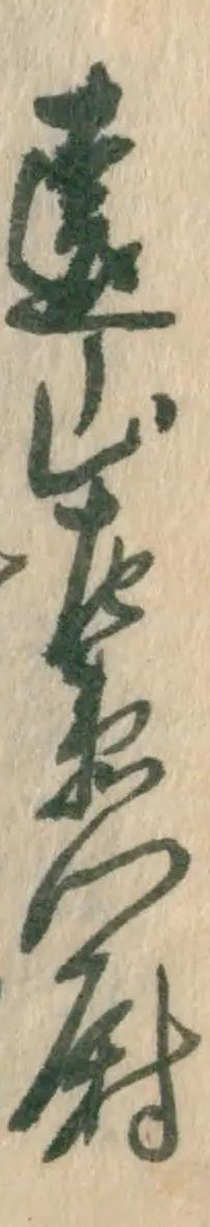遠山左衛門尉
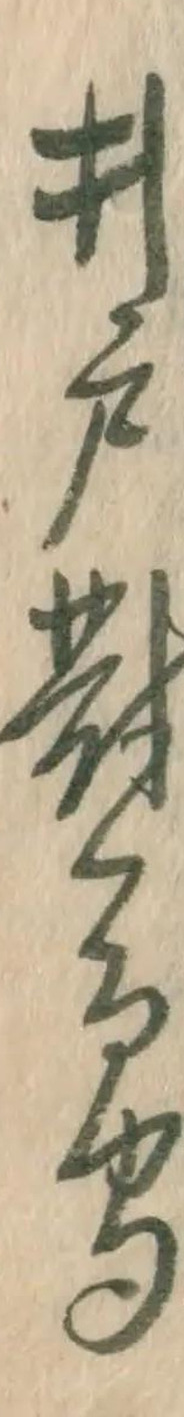井戸対馬守

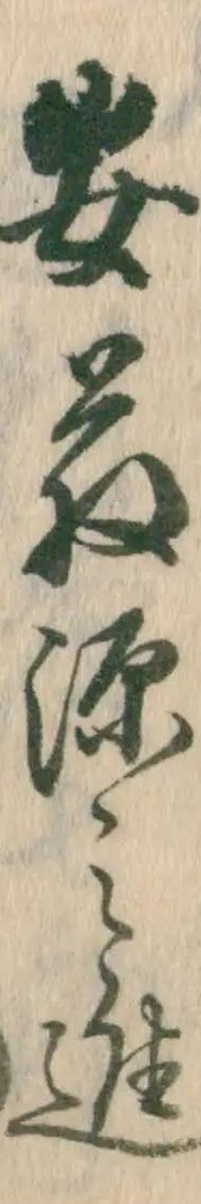安藤源之進
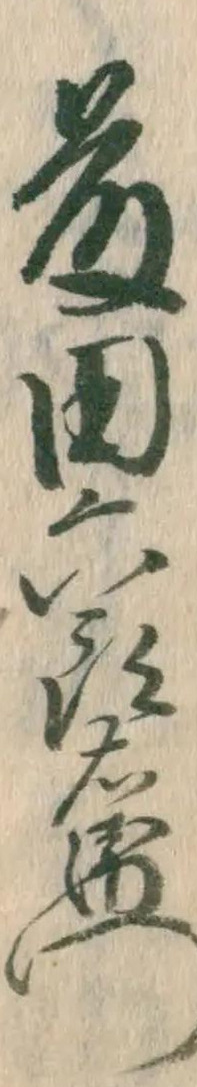藤田六郎右衛門
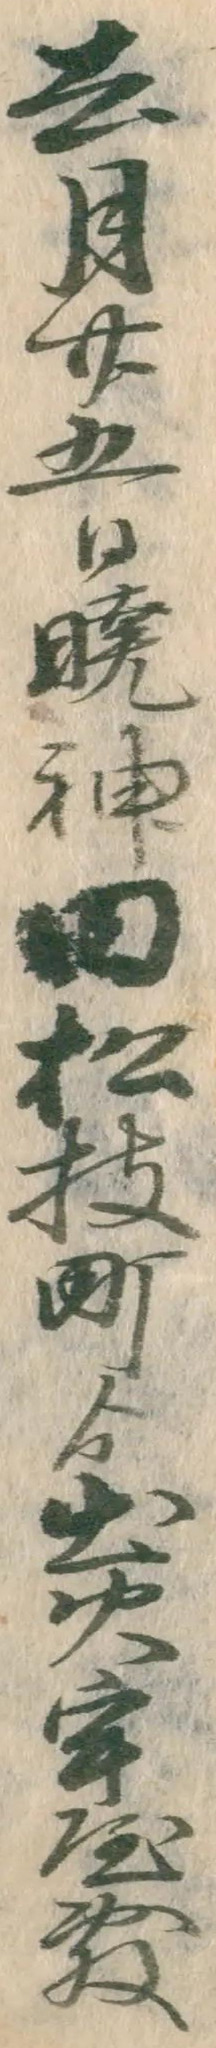去月廿五日暁神田松枝町ゟ出火牢屋敷

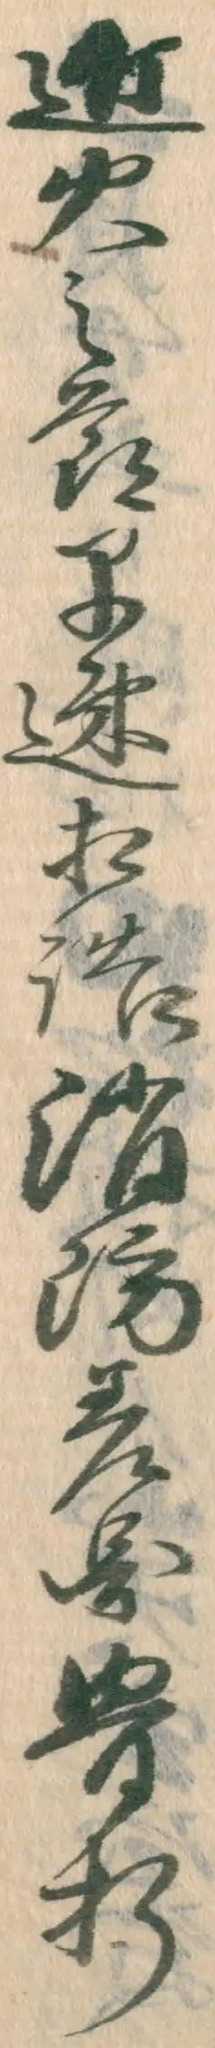近火之節早速相詰消防指図骨折
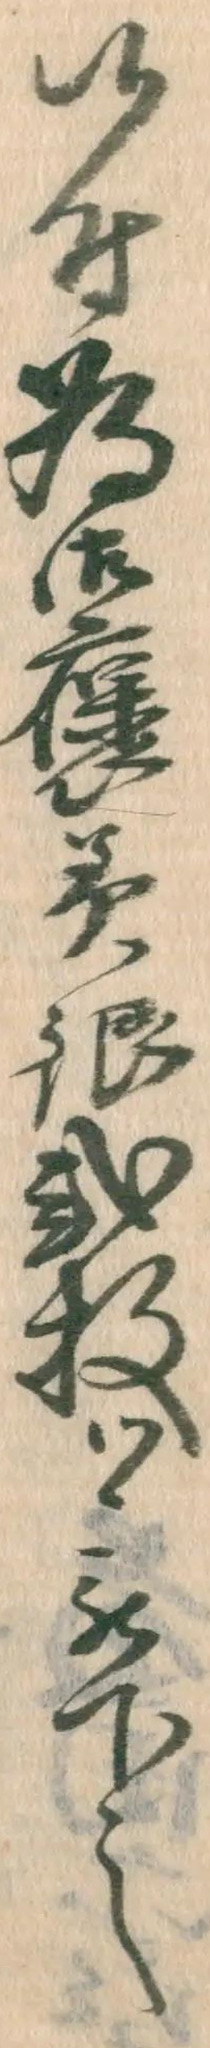候付為御褒美銀弐枚ツヽ被下之
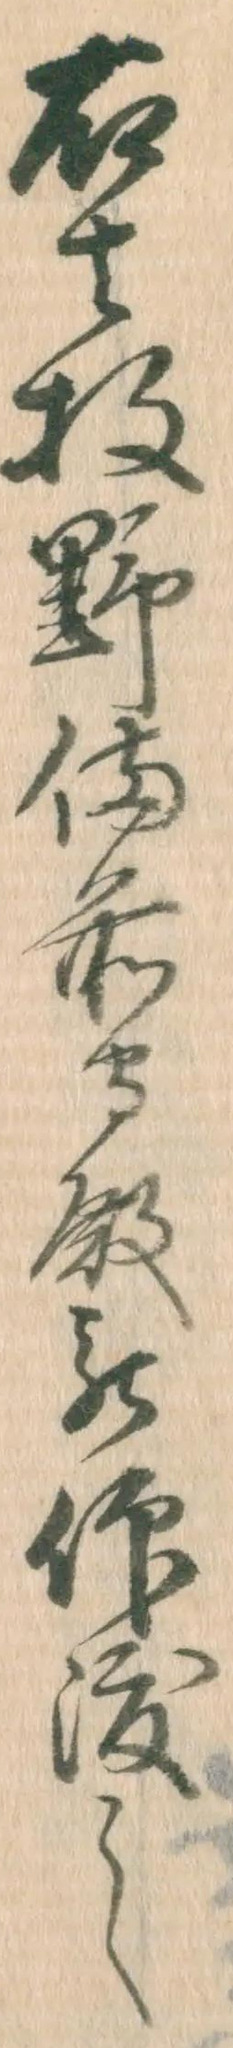右は牧野備前守殿被仰渡之
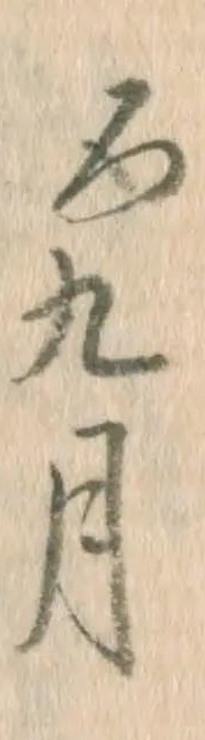酉九月
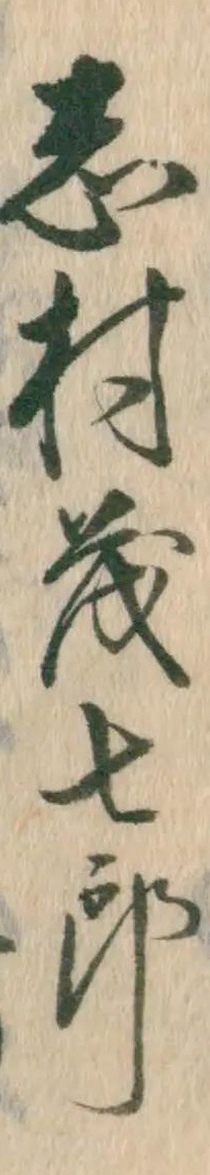志村茂七郎
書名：七十冊物類集 71巻. [44] 四十三 牢屋敷御普請御修覆地震ニ付骨折候牢屋掛御褒美之部
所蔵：国立国会図書館 National Diet Library, JAPAN
